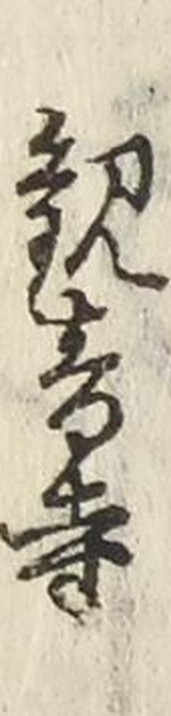観音寺
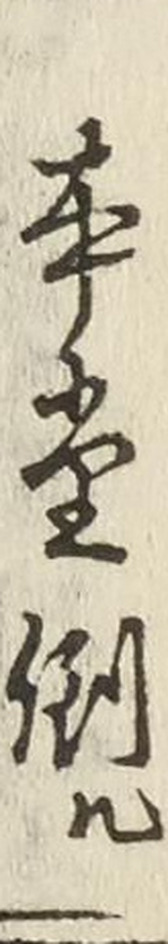本堂倒ル
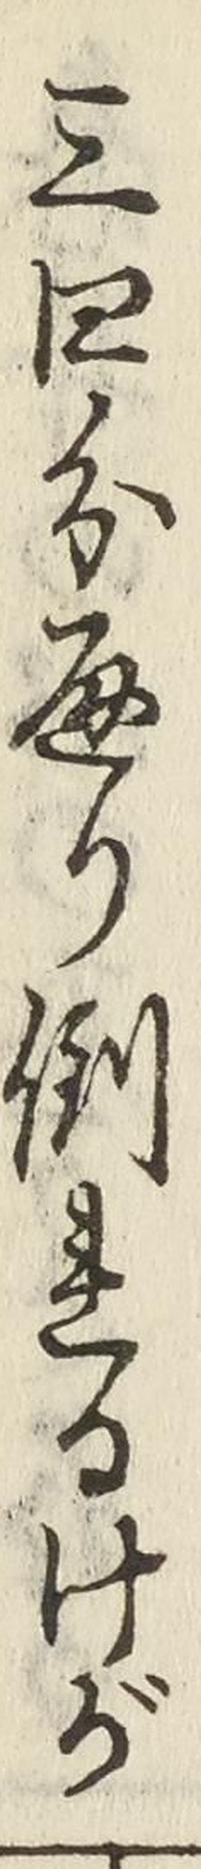三四分通り倒れるけが
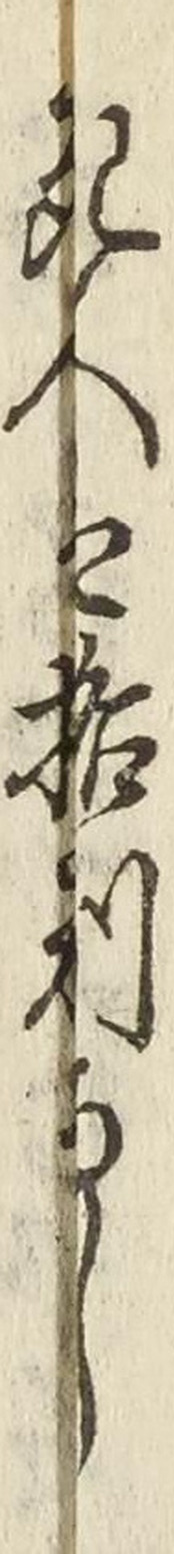死人は格別ねし
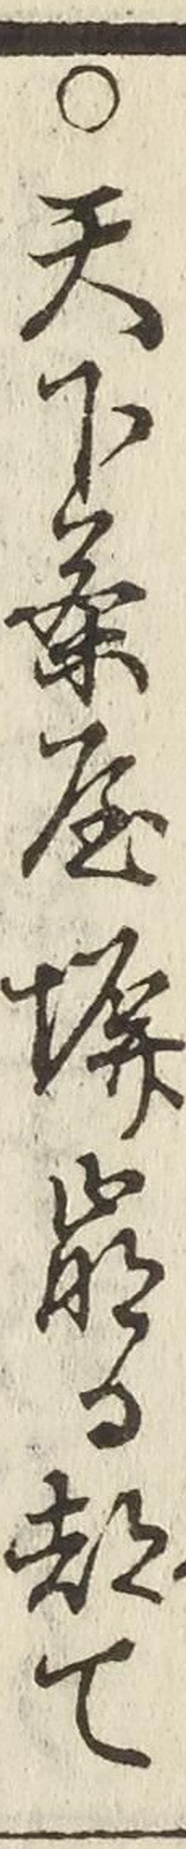○天下茶屋塀崩る都て
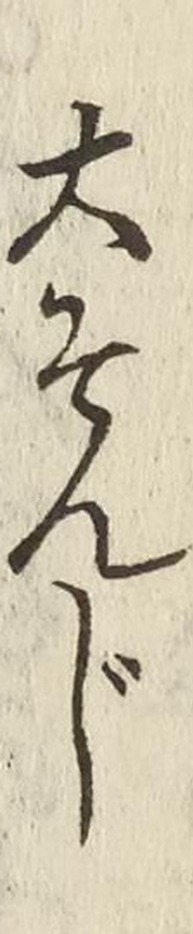大そんじ
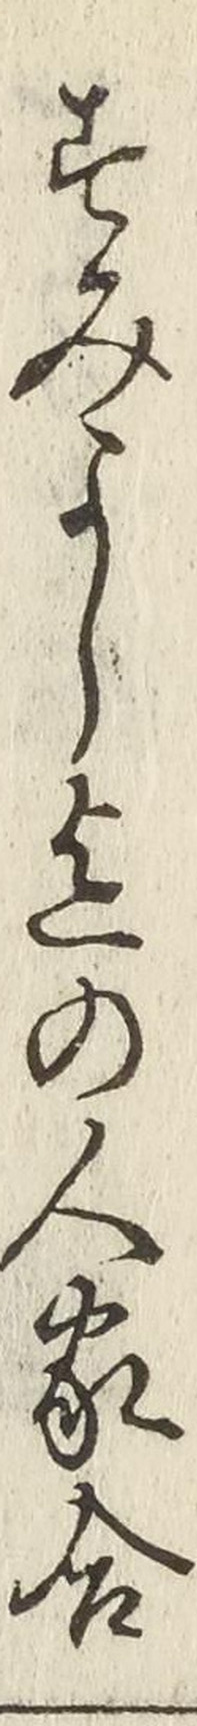すみよし迄の人家合
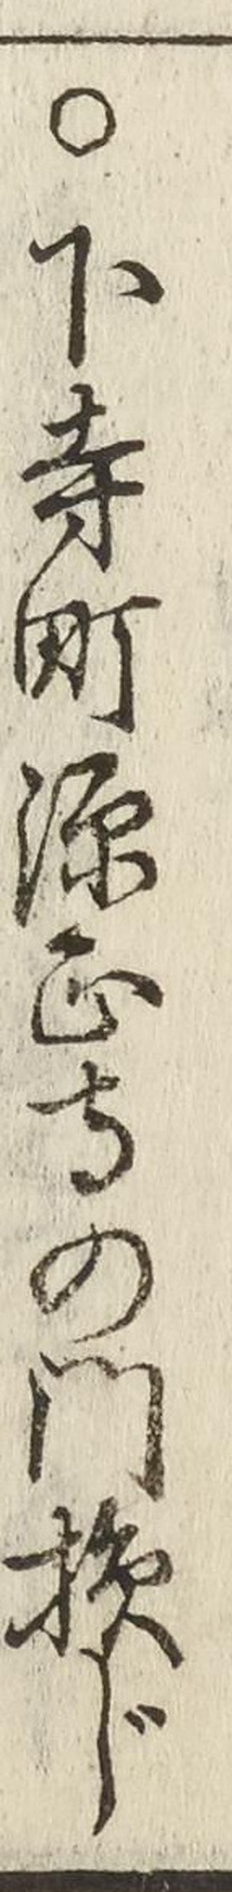○下寺町源正寺の門損じ
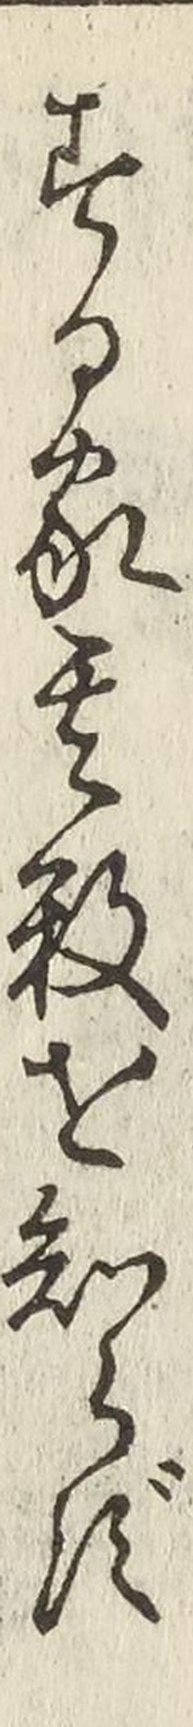する家其数を知らず
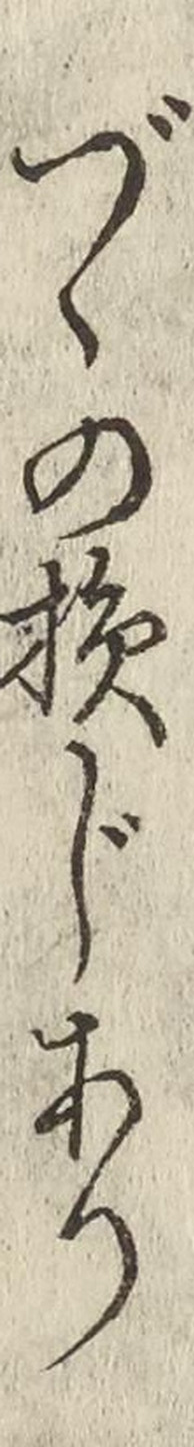づゝの損じあり

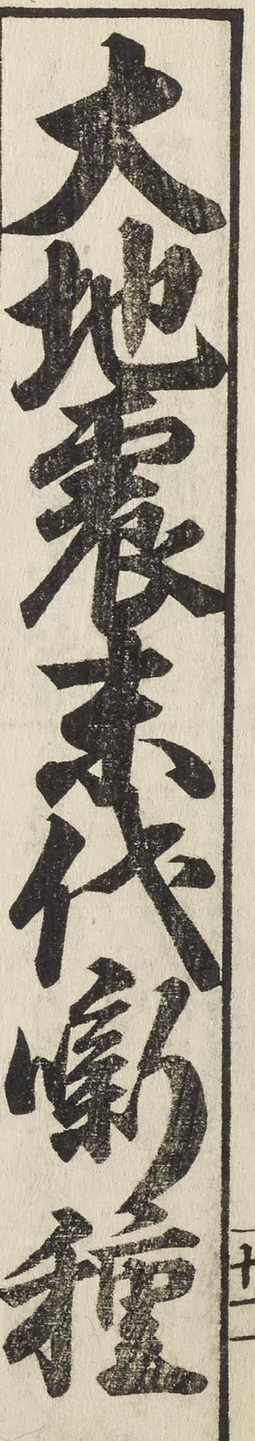大地震末代噺種
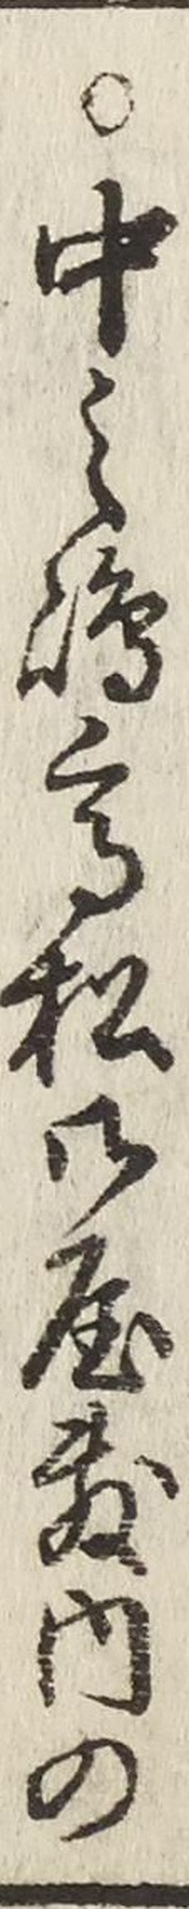○中之嶋高松御屋敷内の
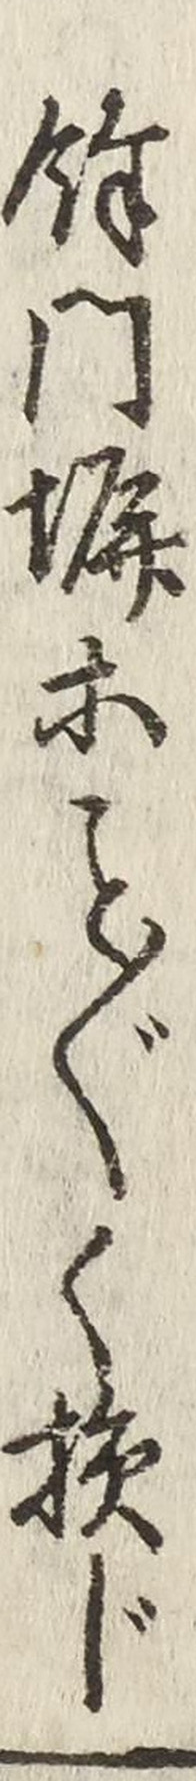余門塀等こと〴〵く損じ
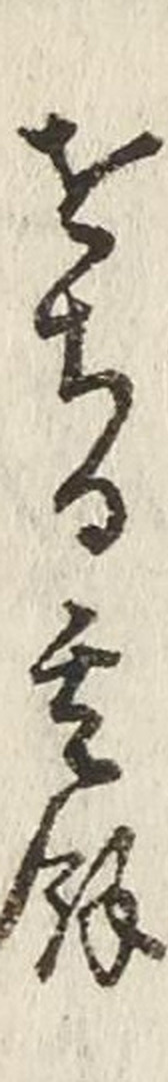をちる其余
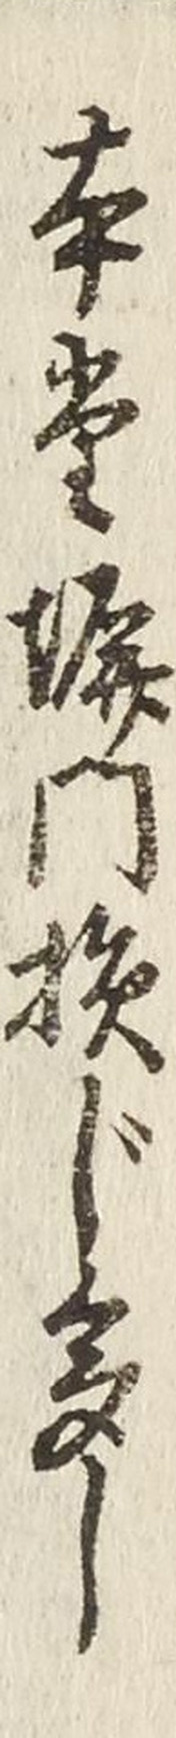本堂塀門損じ多し
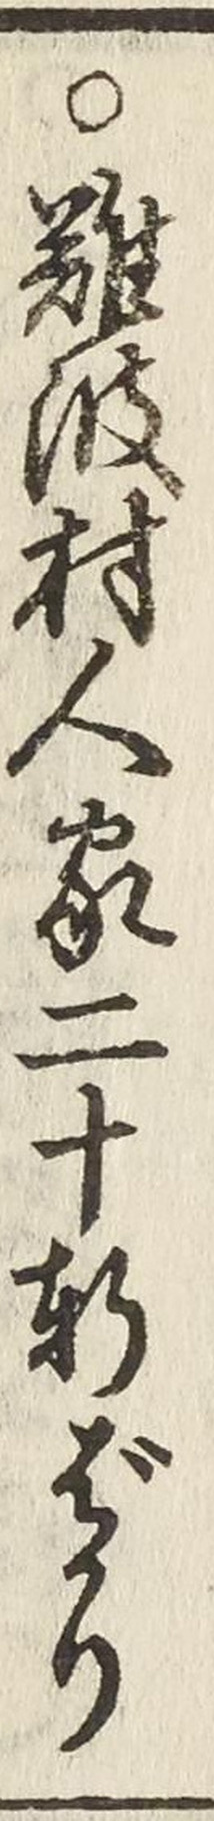○難波村人家二十軒ばり
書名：大地震大津浪末代噺種　（二編　全）
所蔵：東京大学地震研究所図書室 Earthquake Research Institute Library, The University of Tokyo, JAPAN
